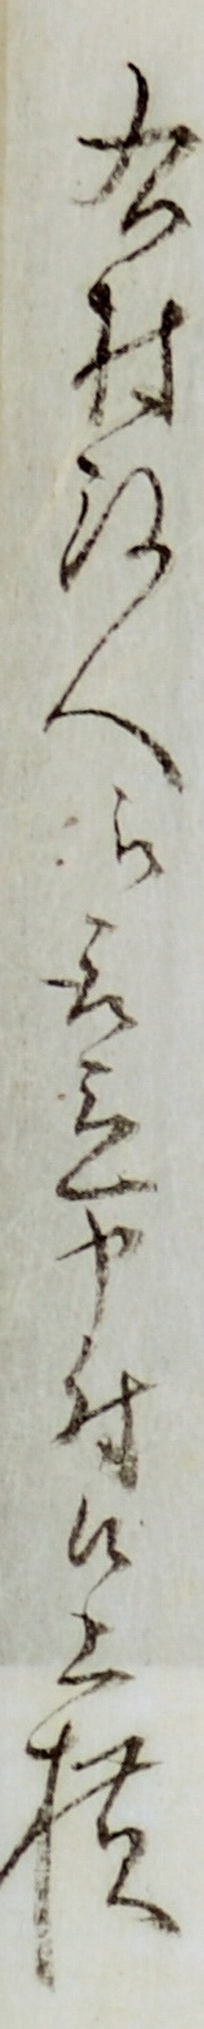右村役人え取立申付候上横

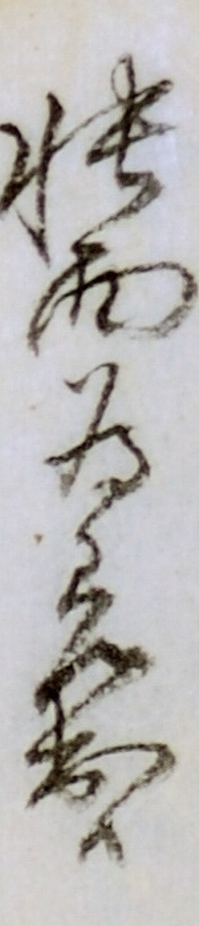帳面為差出候
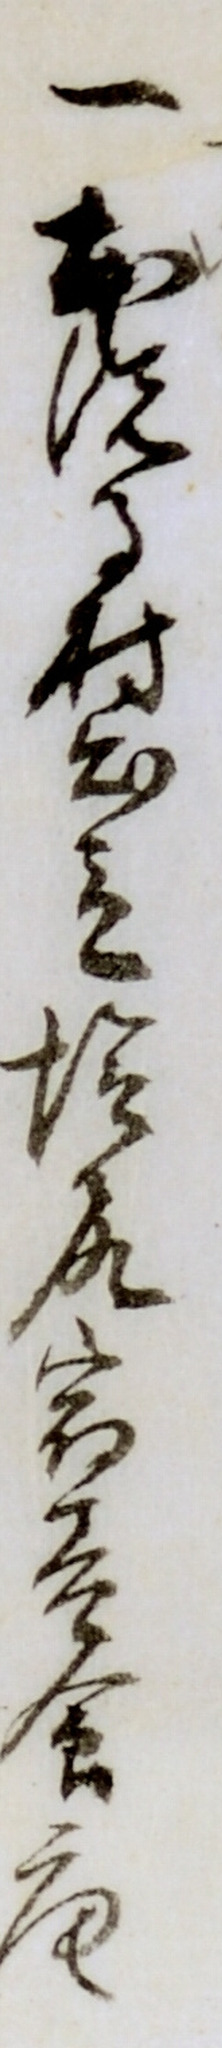一本洗馬村出立塩尻宿昼食唐
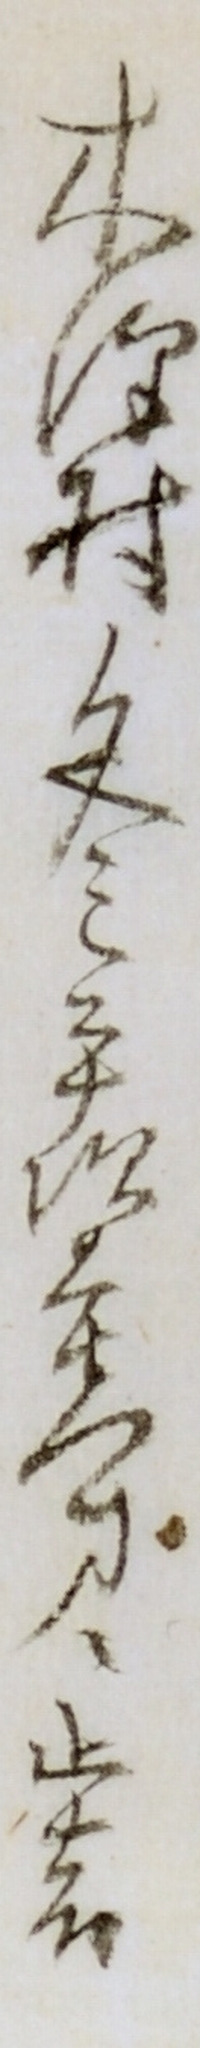木沢村名主平次右衛門方に止宿
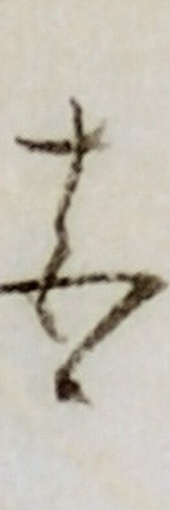十五日
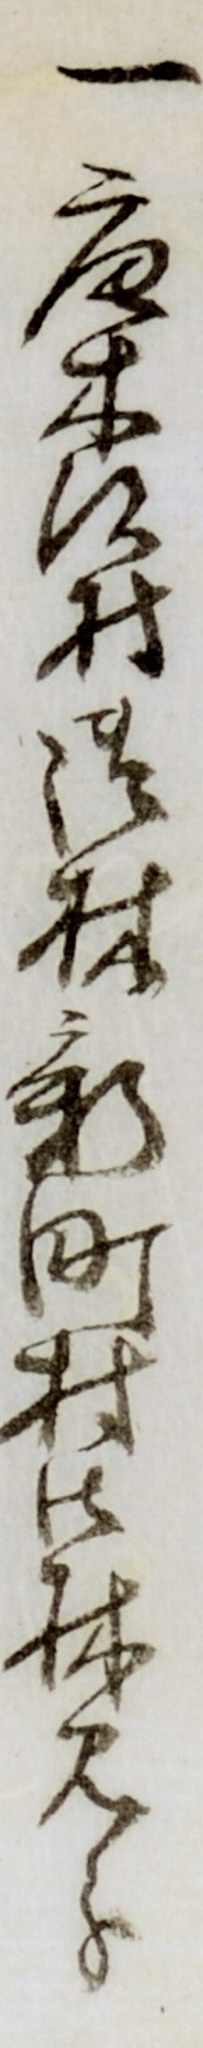一唐木沢村御林新町村御林見分
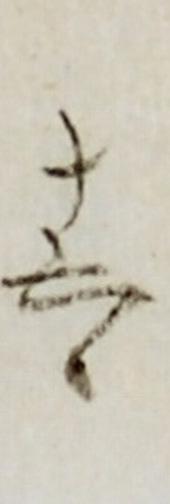十六日
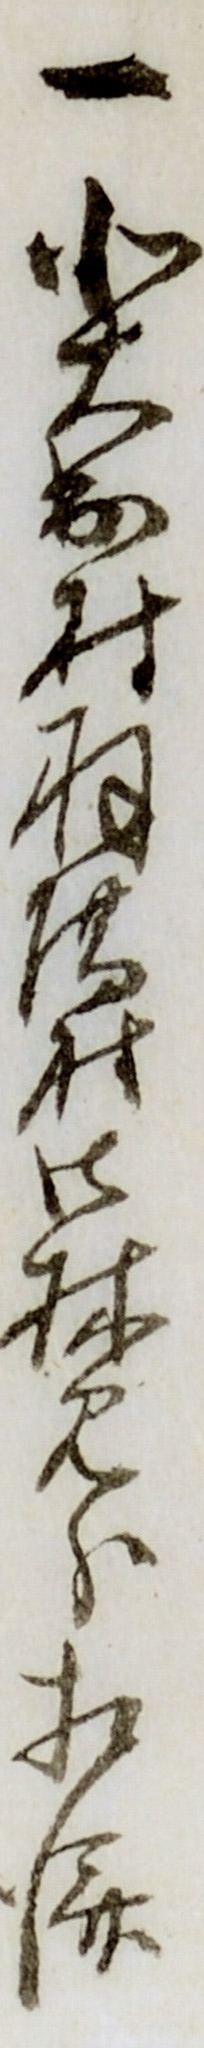一北大出村羽場村御林見分相済
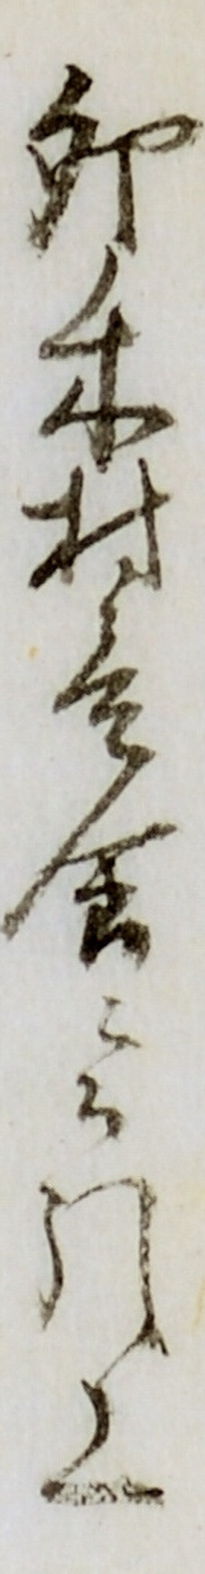卯ノ木村昼食にて引上
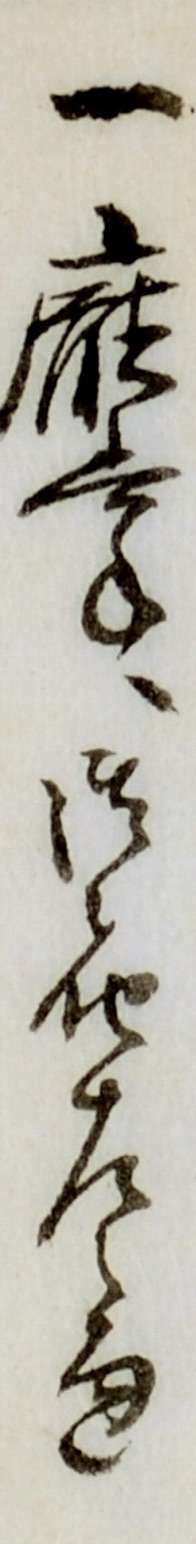一庁掌へ御届左之通
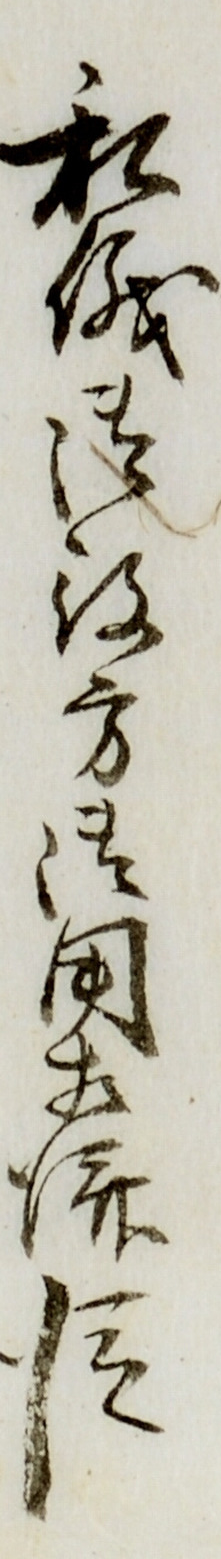私儀御役方御用相済従
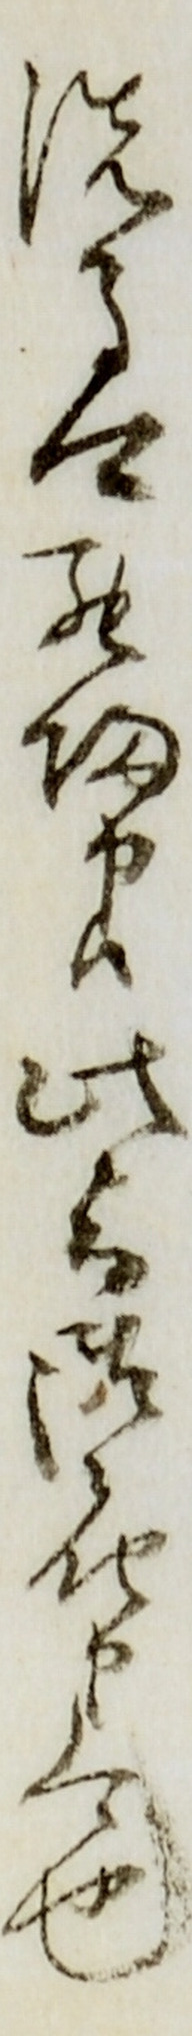洗馬郷罷帰申候此旨御届申上候也
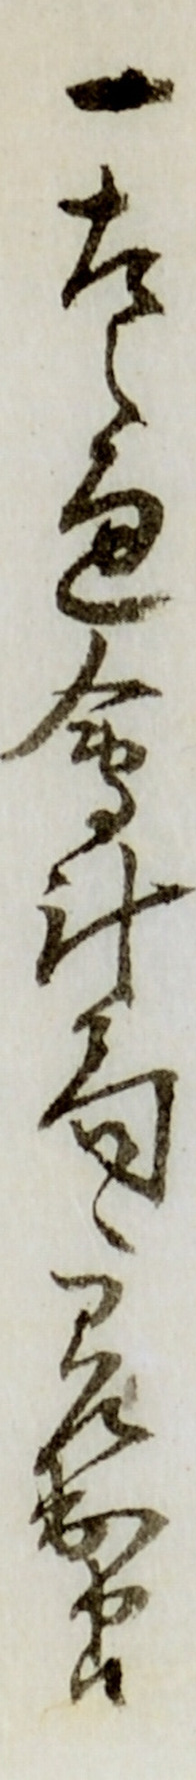一左之通会計局へ差出申候
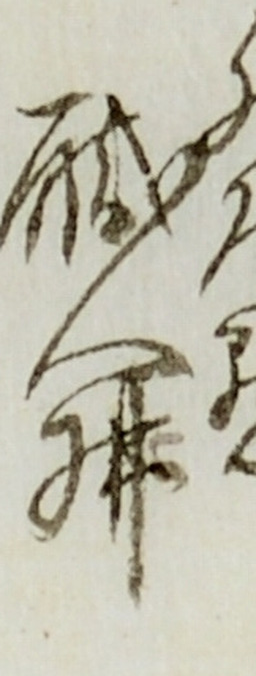職人払
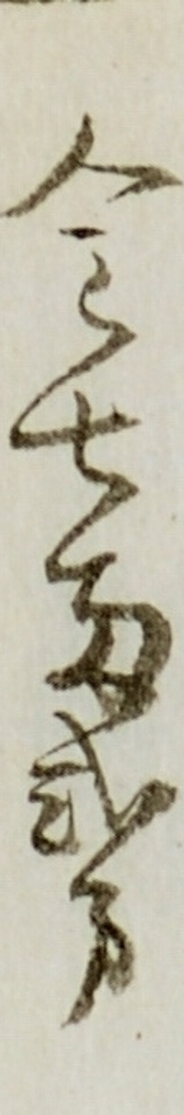一金七両弐分同
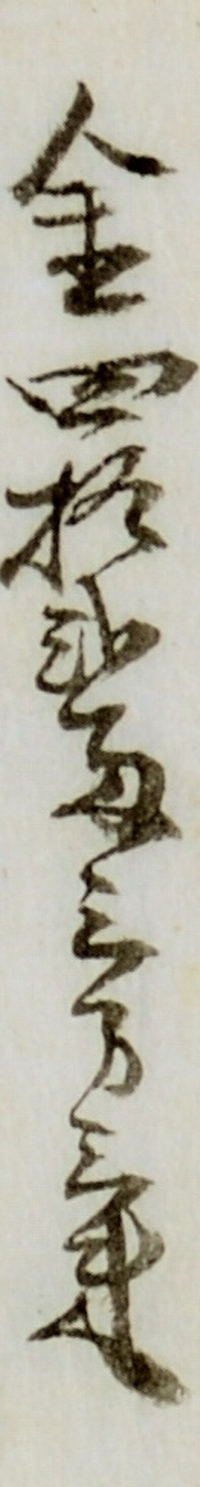〆金四拾弐両三分三朱
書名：山林方諸事御用留
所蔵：伊那市立高遠町図書館・合同会社AMANE
